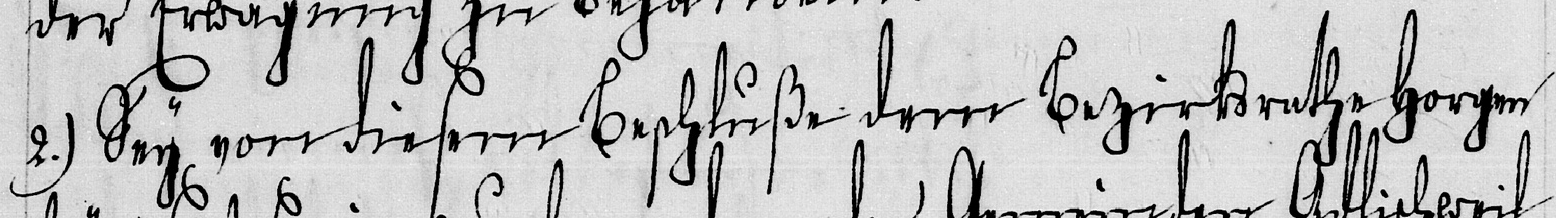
2.) Sey von diesem Beschluße dem Bezirksrathe Horgen
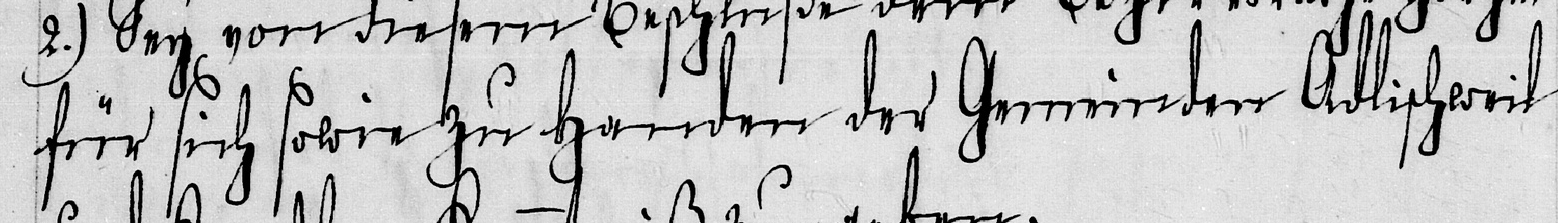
für sich sowie zu Handen der Gemeinden Adlischweil
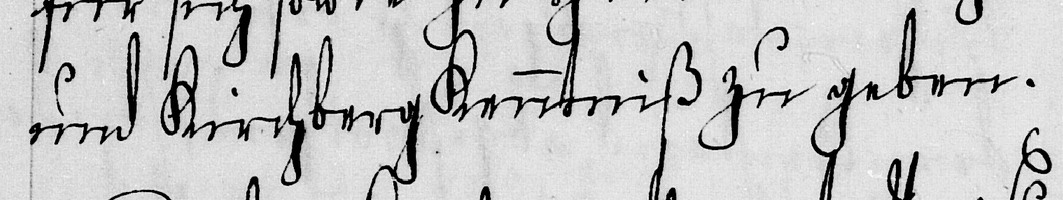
und Kirchberg Kenntniß zu geben.
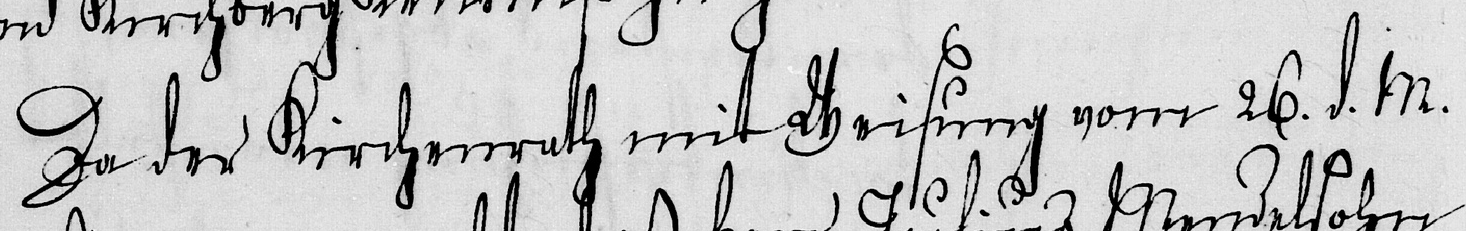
Da der Kirchenrath mit Weisung vom 26. d. M.
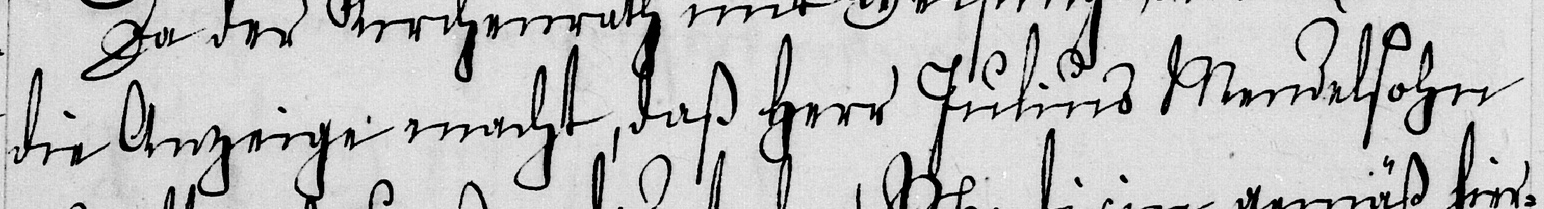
die Anzeige macht, daß Herr Julius Mendelsohn
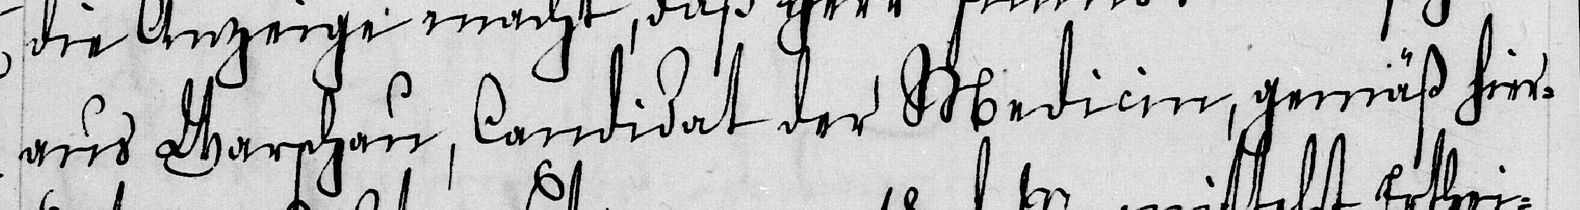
aus Warschau, Candidat der Medicin, gemäß hier¬
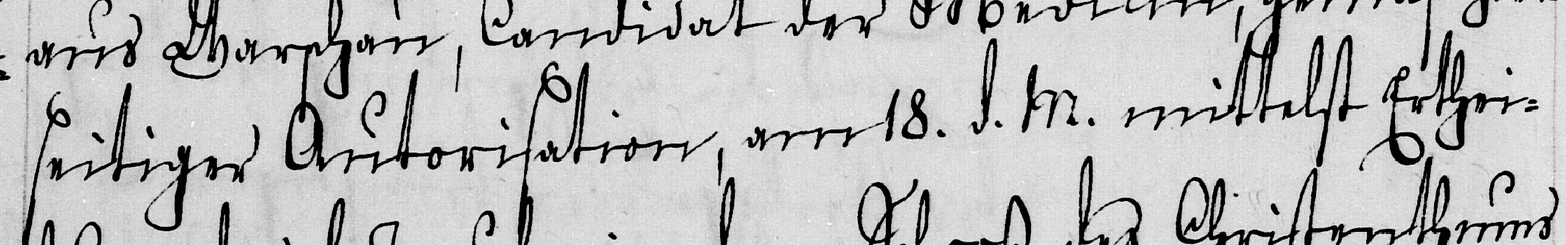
seitiger Autorisation, am 18. d. M. mittelst Erthei¬
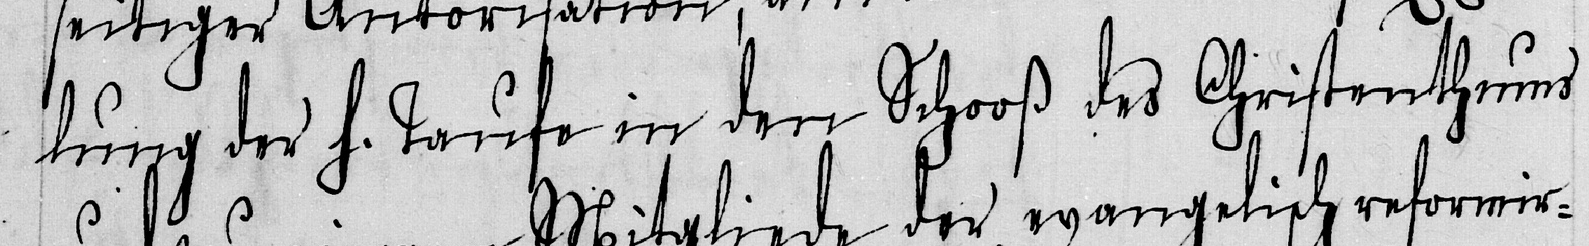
lung der h. Taufe in den Schooß des Christenthums
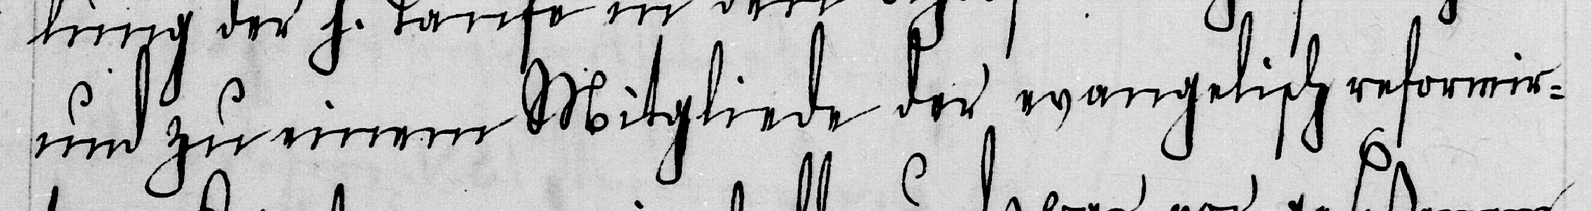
und zu einem Mitgliede der evangelisch reformir¬
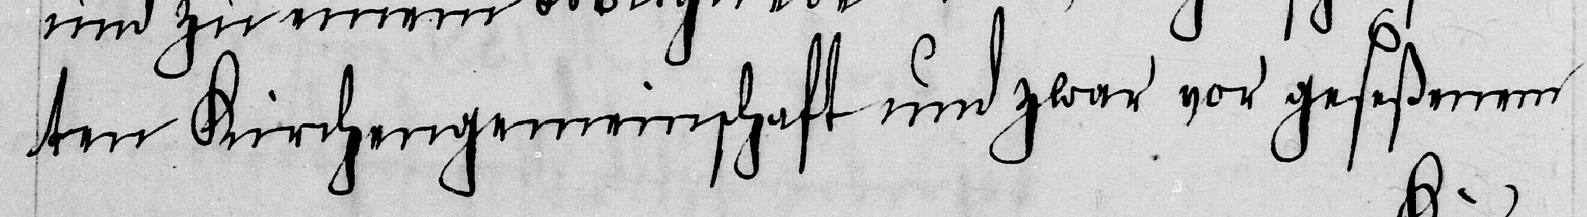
ten Kirchengemeinschaft und zwar vor geseßenem
